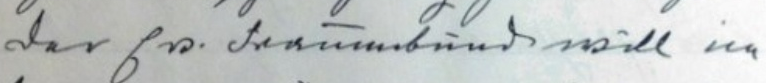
Der Ev. Frauenbund will im
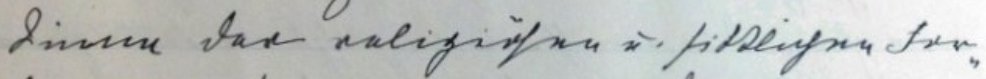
Sinne der religiösen u. sittlichen For
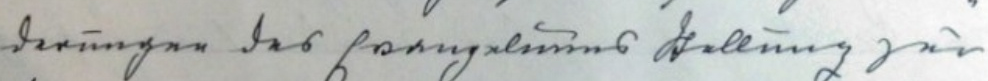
derungen des Evangeliums Haltung zur
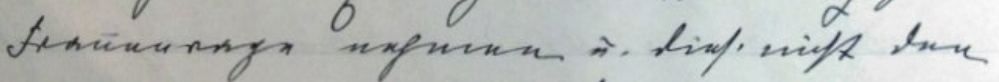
Frauenfrage nehmen u. dies nicht den
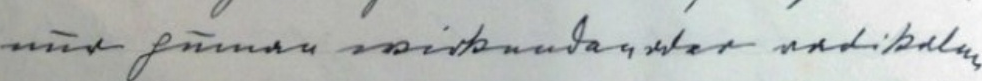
nur human wirkenden aber radikalen
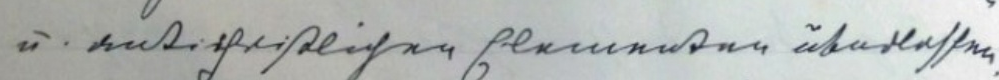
u. antichristlichen Elementen überlassen.
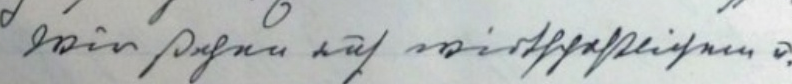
Wie stehen auf wirtschaftlichem u.
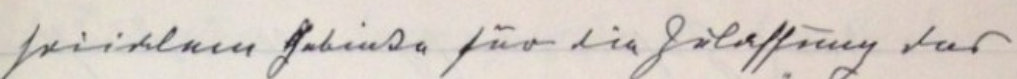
soîialen Gebiete für die Zulassung des
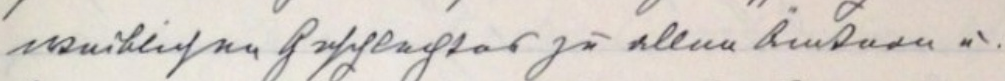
weiblichen Geschlechts zu allen Ämtern u.
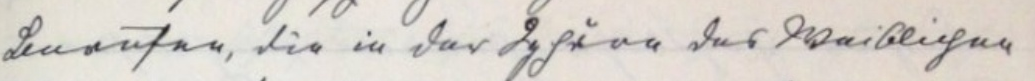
Berufen, die in der Spähre des Weiblichen
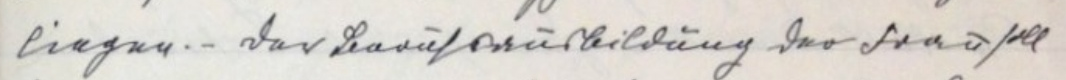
liegen. Der Berufsausbildung der Frau soll
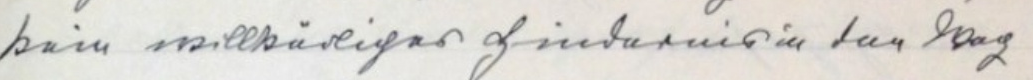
kein willkürliches Hindernis in den Weg
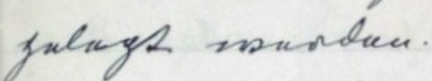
gelegt werden.
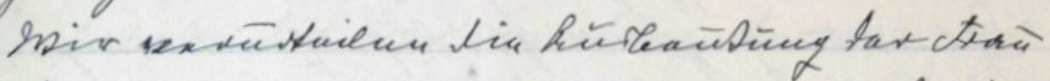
Wir verurteilen die Ausbeutung der Frau
